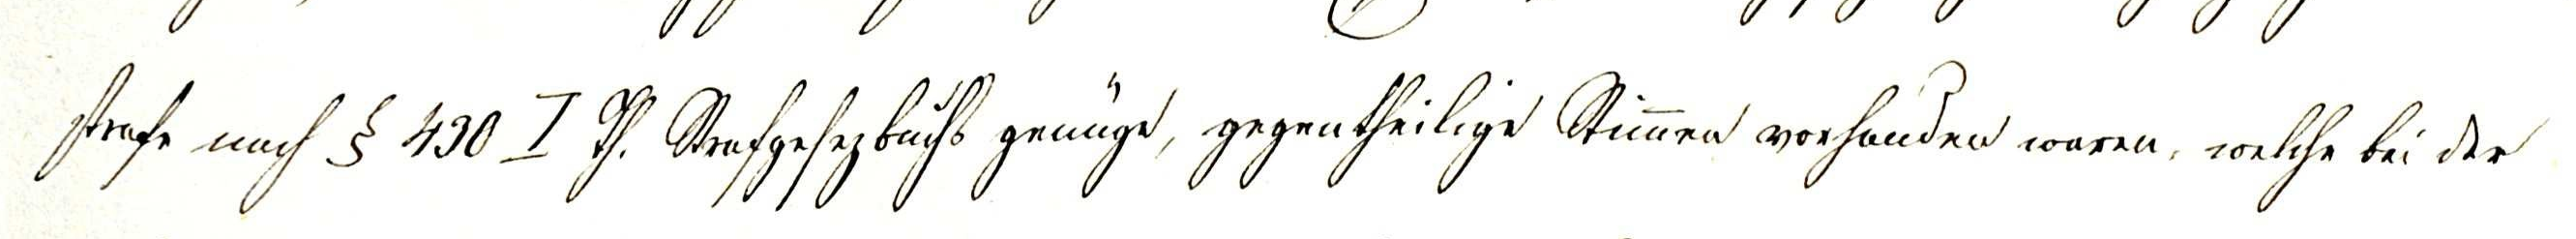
strafe nach § 430 I Th. Strafgesezbuchs genüge, gegentheilige Stimmen vorhanden waren, welche bei der
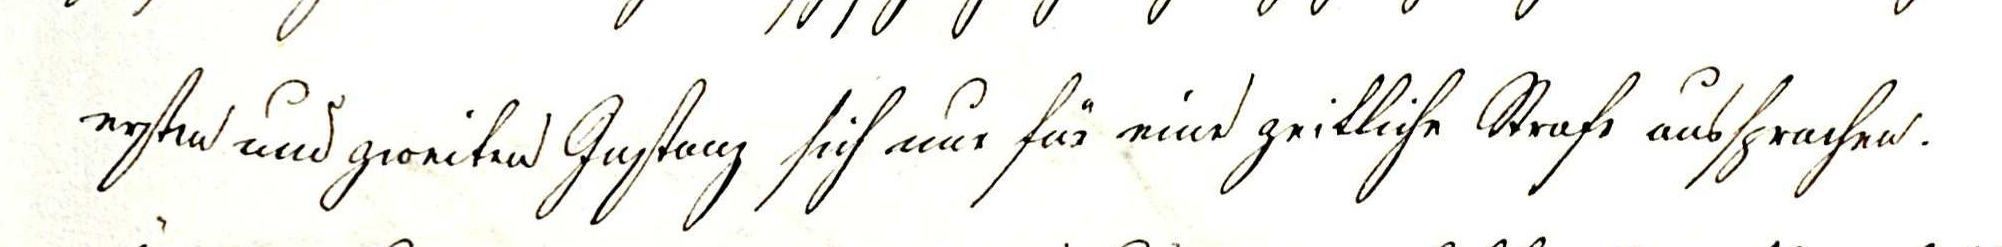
ersten und zweiten Jnstanz sich nur für eine zeitliche Strafe aussprachen.
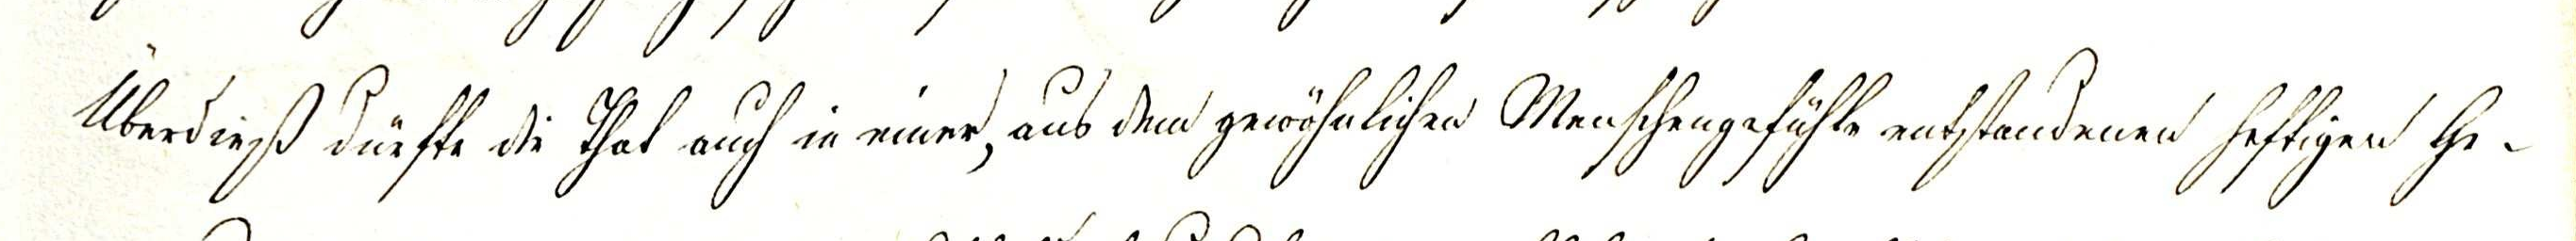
Überdieß dürfte die That auch in einer, aus dem gewöhnlichen Menschengefühle entstandenen heftigen Ge¬
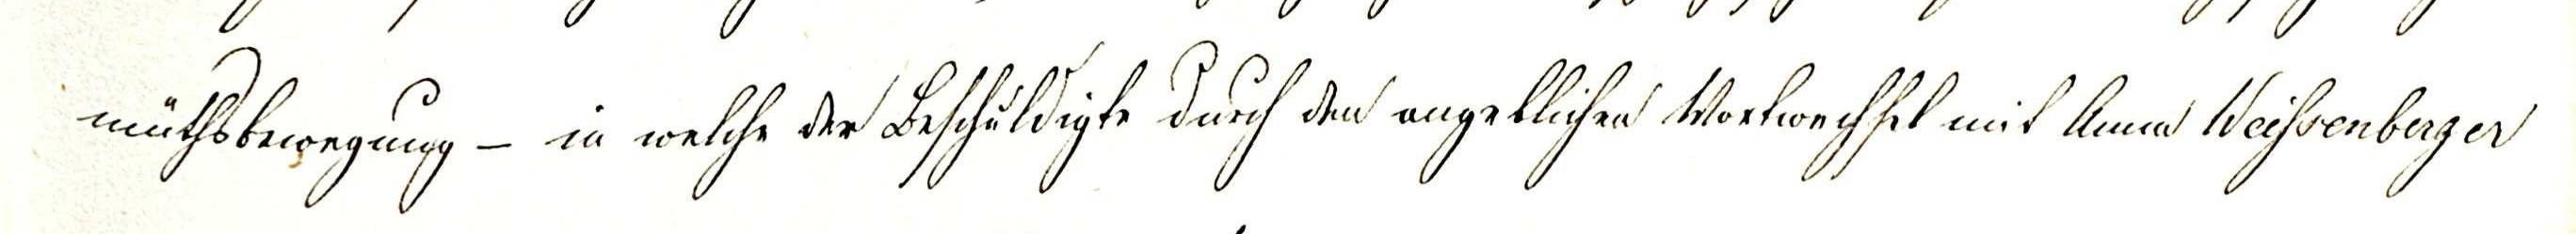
müthsbewegung - in welcheder Beschuldigte durch den angeblichen Wortwechsel mit Anna Weissenberger
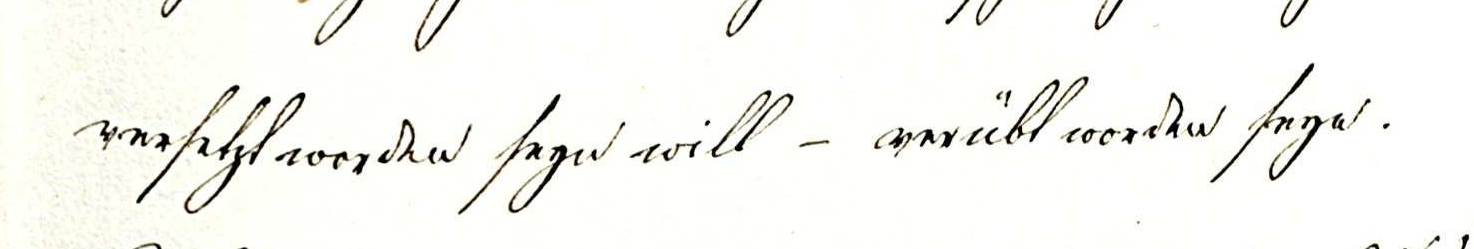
versetzt worden seyn will - verübt worden seyn.
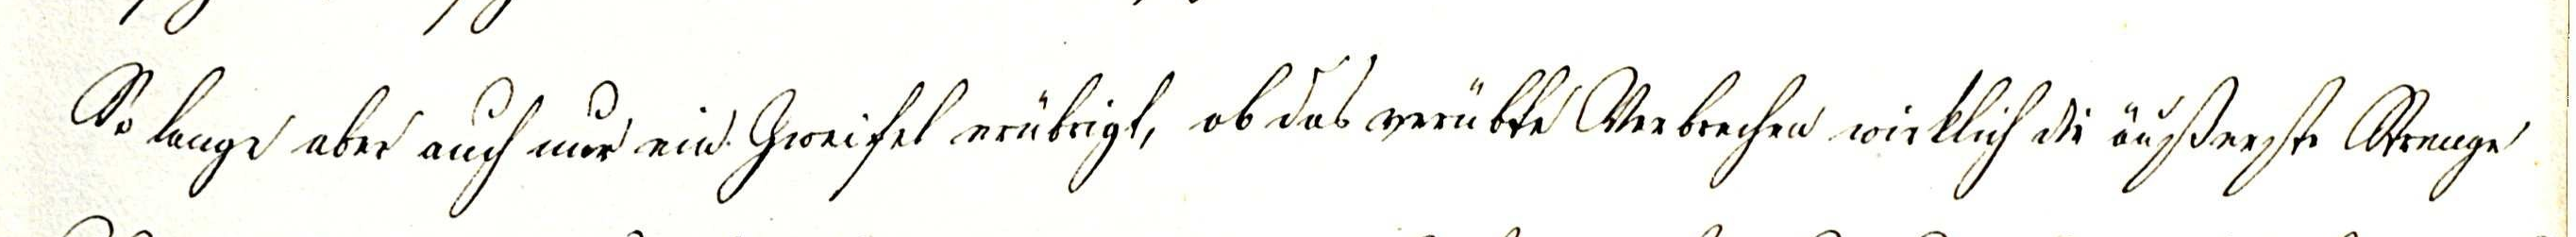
Sol lange aber auch nur ein Zweifel erübrigt, ob das verübte Verbrechen wirklich die äußerste Strenge
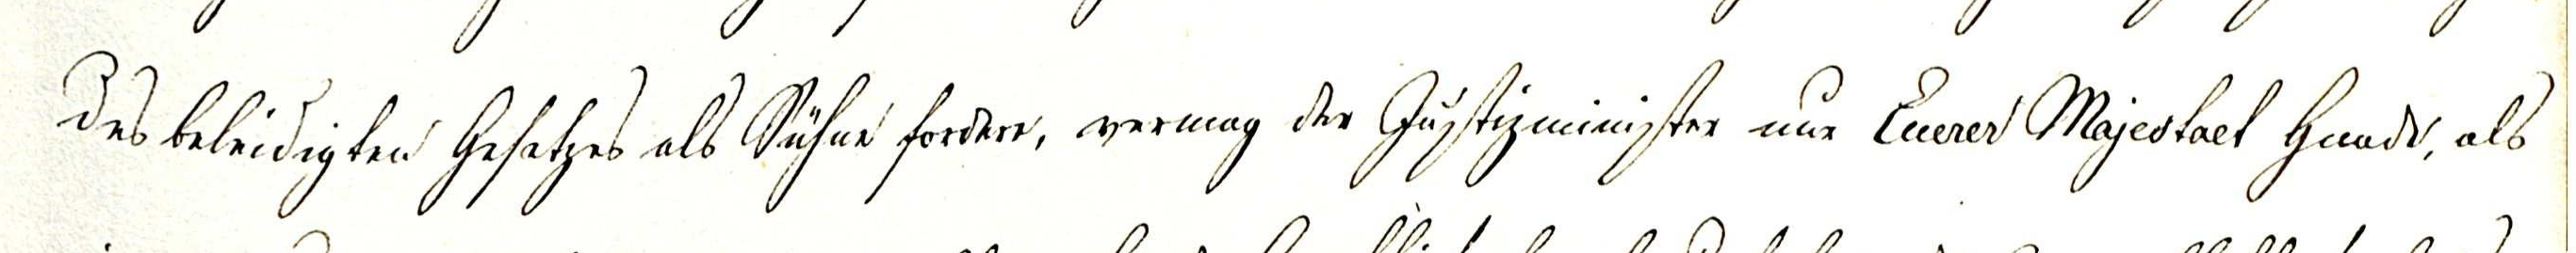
des beleidigten Gesetzes als Sühne fordere, vermag der Justizminister nur Euerer Majestaet Hande, als
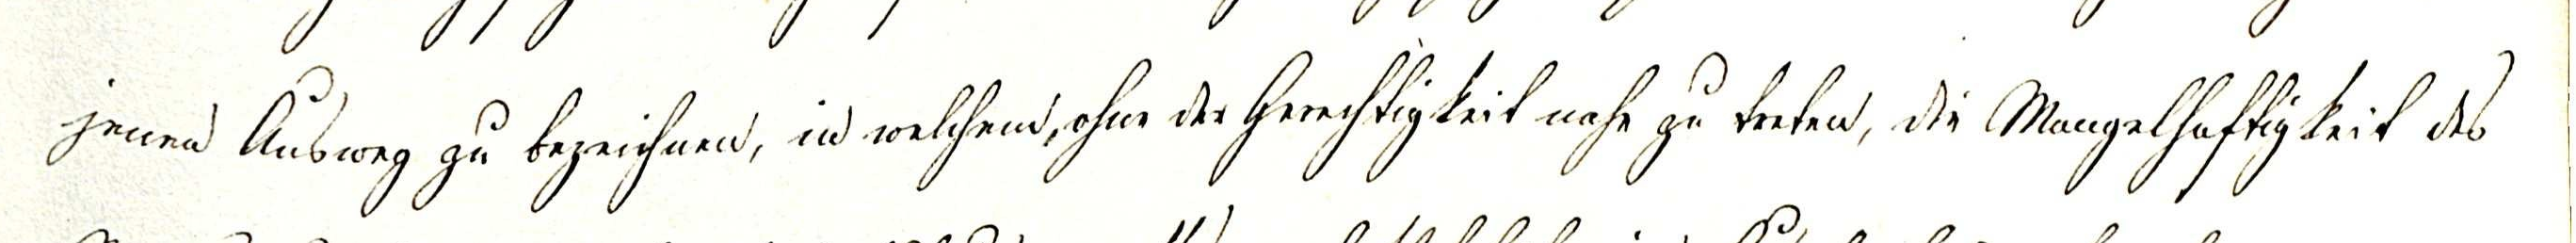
jenen Ausweg zu bezeichnen, in welchem, ohne der Gerechtigkeit nahe zu treten, die Mangelhaftigkeit des
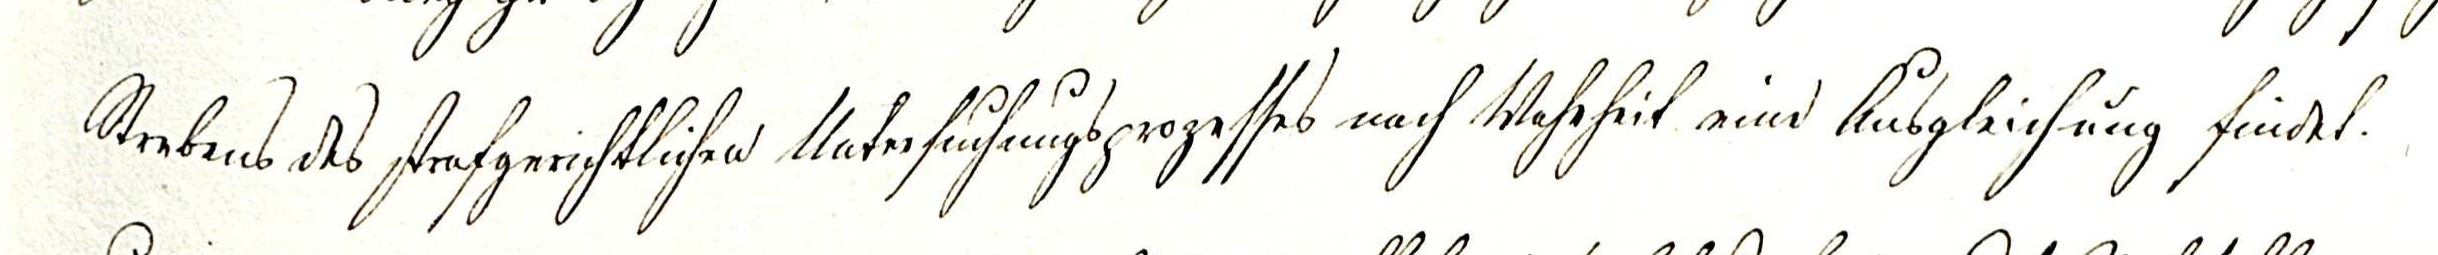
Strebens des strafgerichtlichen Untersuchungsprozesses nach Wahrheit eine Ausgleichung findet.
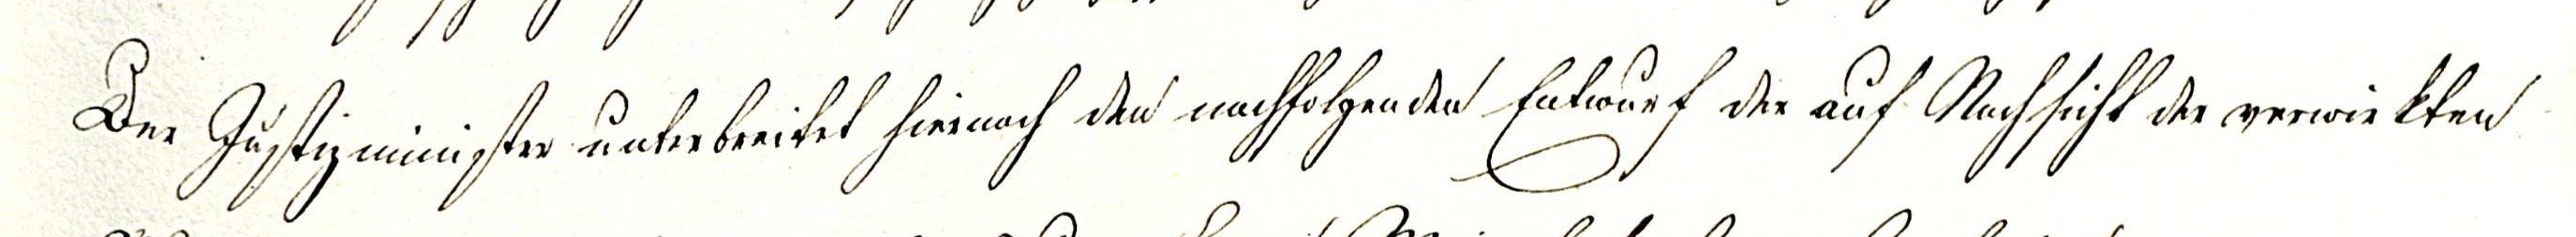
Der Justizminister unterbreitet hiernach den nachfolgenden Entwurf der auf Nachsicht der verwirkten
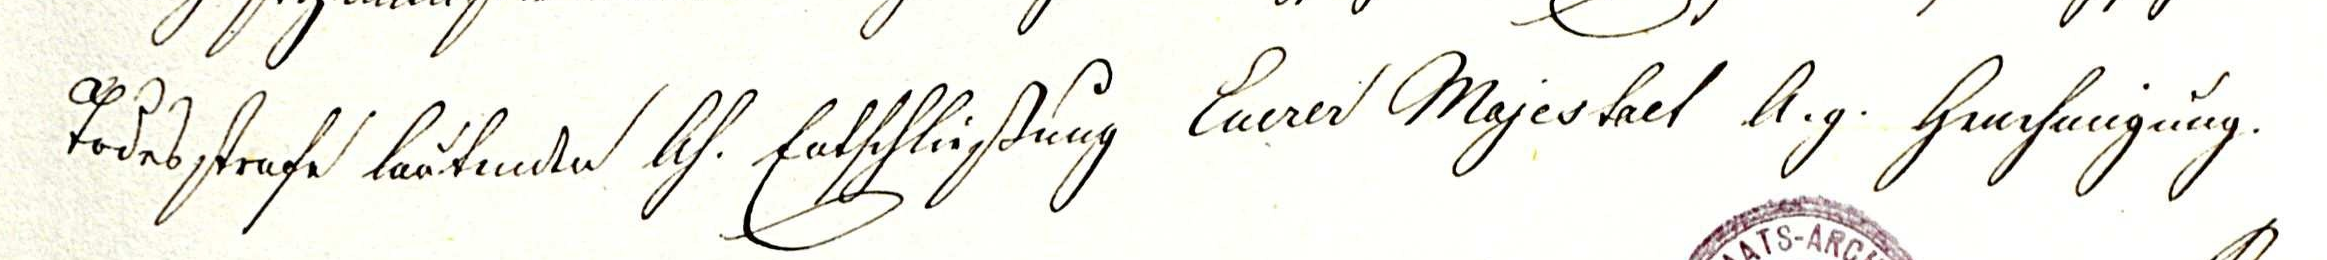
Todesstrafe lautenden Ah. Entschließung Euerer Majestaet A. g. Genehmigung.
